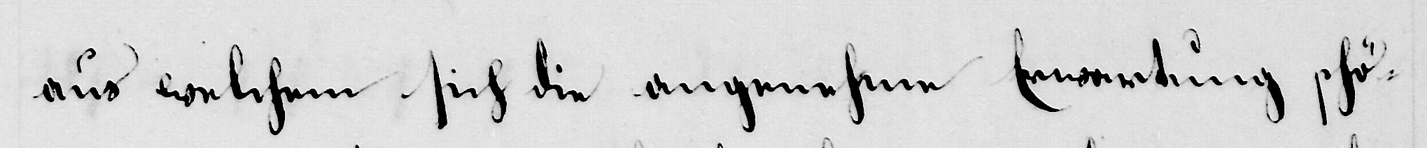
aus welchem sich die angenehme Erwartung schö¬
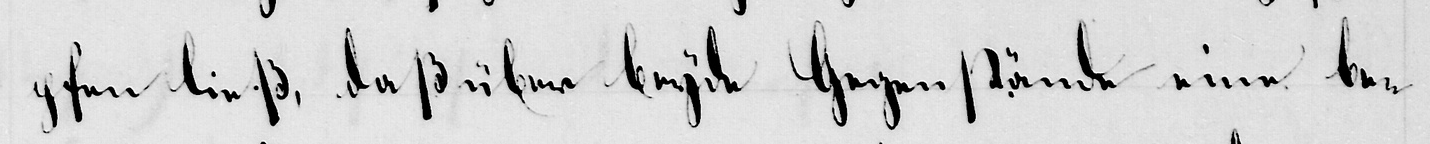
pfen ließ, daß über beyde Gegenstände eine be¬
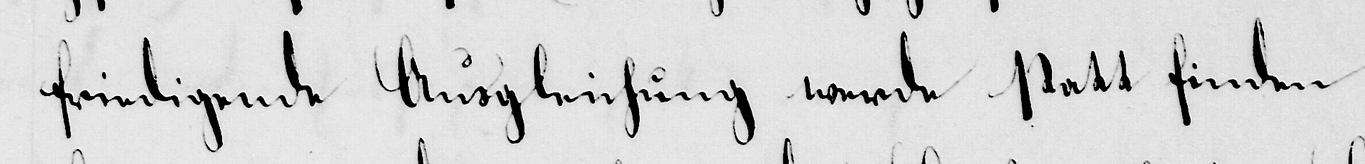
friedigende Ausgleichung werde statt finden
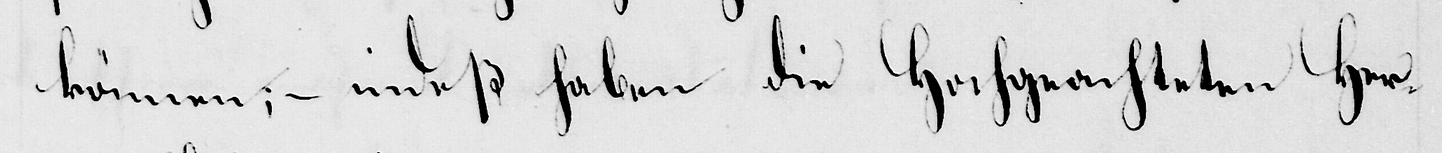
können; – indeß haben die Hochgeachteten Her¬
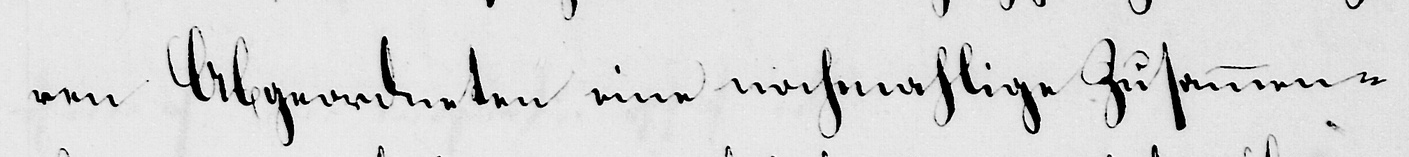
ren Abgeordneten eine nochmahlige Zusammen¬
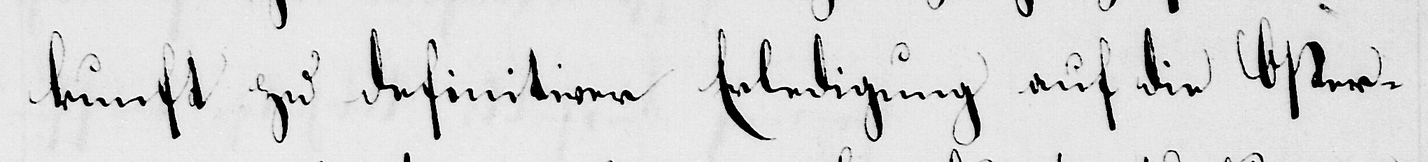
kunft zu definitiver Erledigung auf die Oster¬
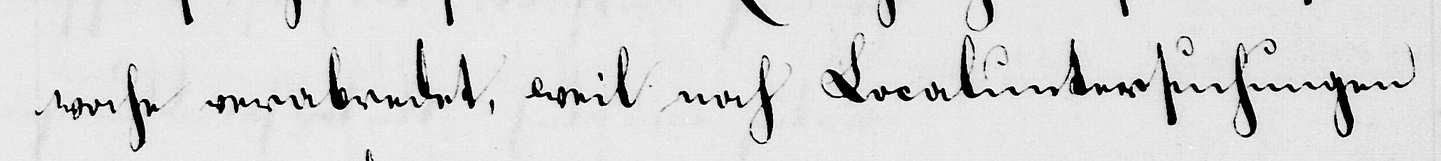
woche verabredet, weil noch Localuntersuchungen
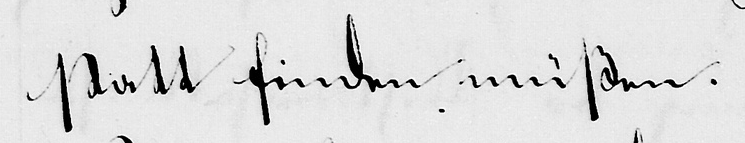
statt finden müßen.
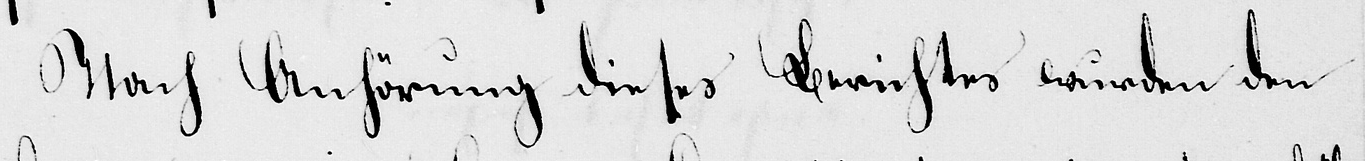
Nach Anhörung dieses Berichtes wurden den
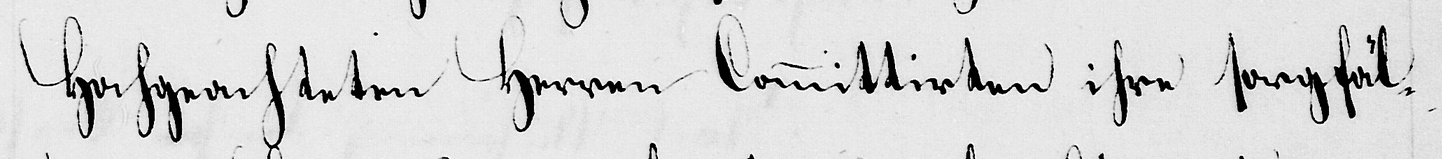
Hochgeachteten Herren Committirten ihre sorgfäl¬
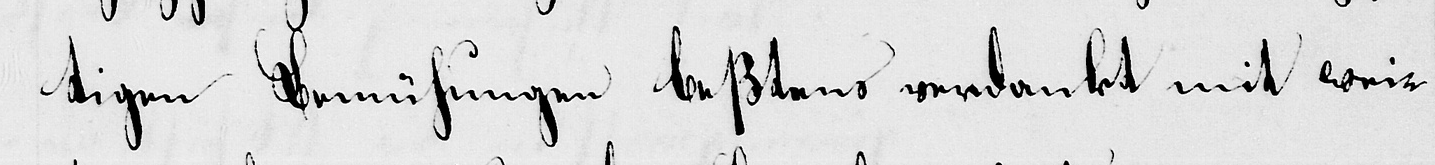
tigen Bemühungen beßtens verdankt mit wei¬
